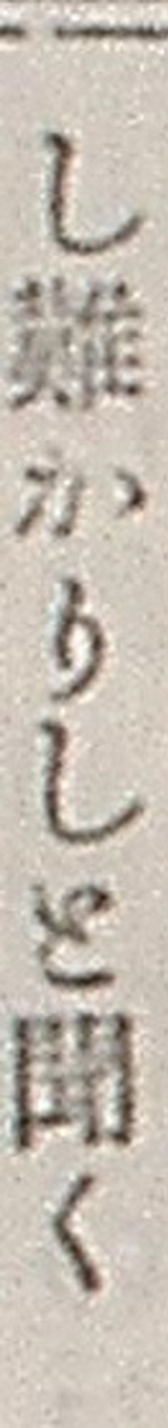し難かりしと聞く
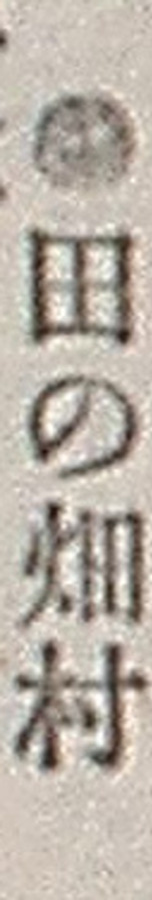●田の畑村
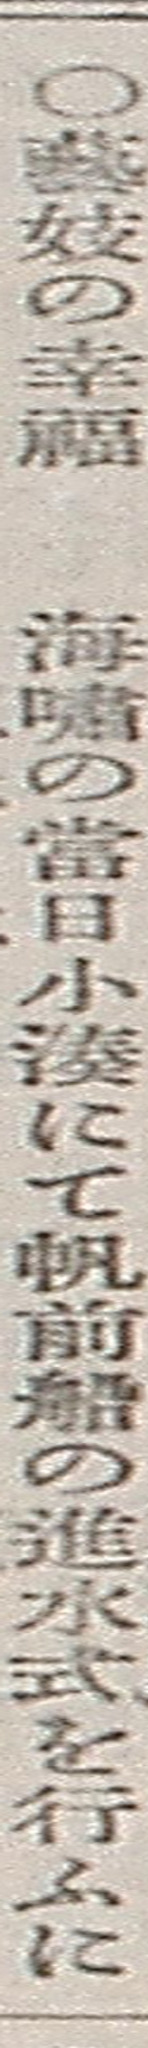○芸妓の幸福海嘯の当日小湊にて帆前船の進水式を行ふに
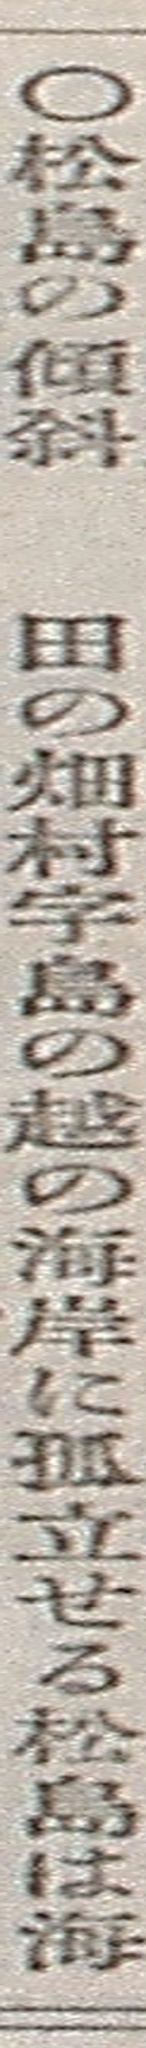○松島の傾斜田の畑村字島の越の海岸に孤立せる松島は海
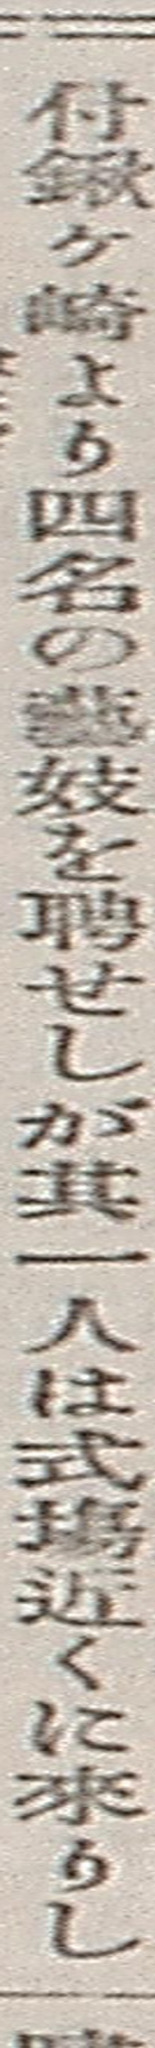付鍬ヶ崎より四名の芸妓を聘せしが其一人は式場近くに来りし
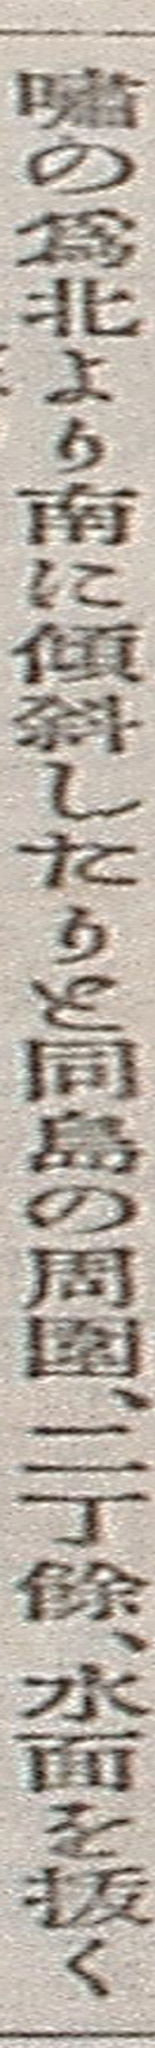嘯の為北より南に傾斜したりと同島の周囲、二丁余、水面を抜く
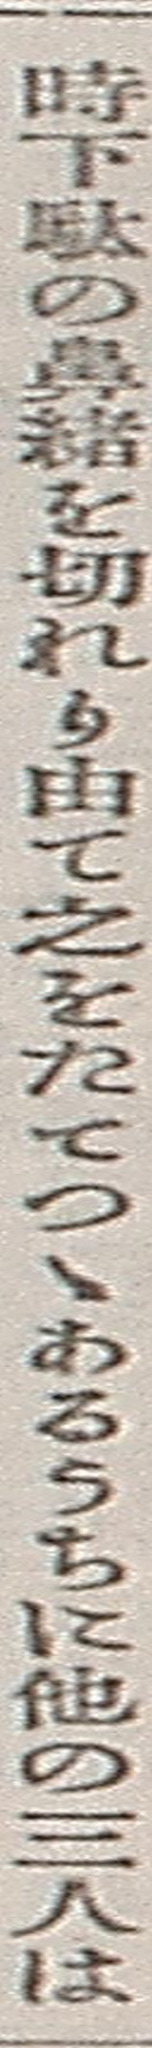時下駄の鼻緒を切れり由て之をたてつゝあるうちに他の三人は
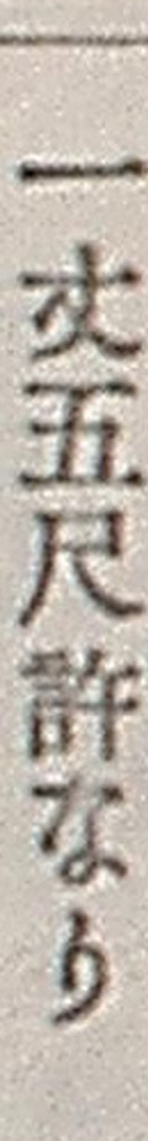一丈五尺許なり

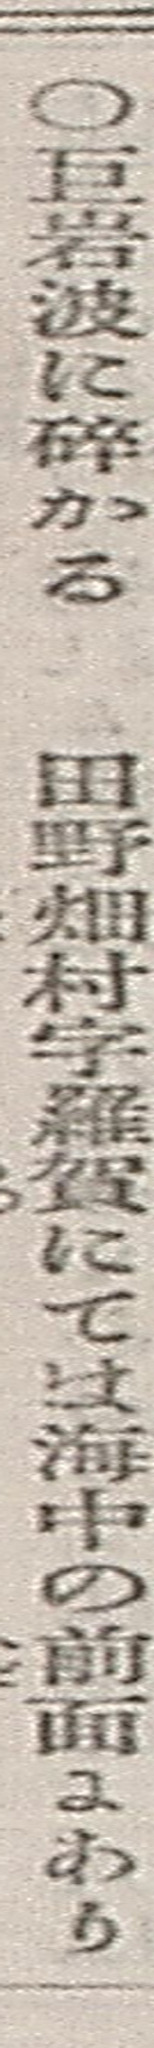〇巨岩波に砕かる田野畑村字羅賀にては海中の前面にあり
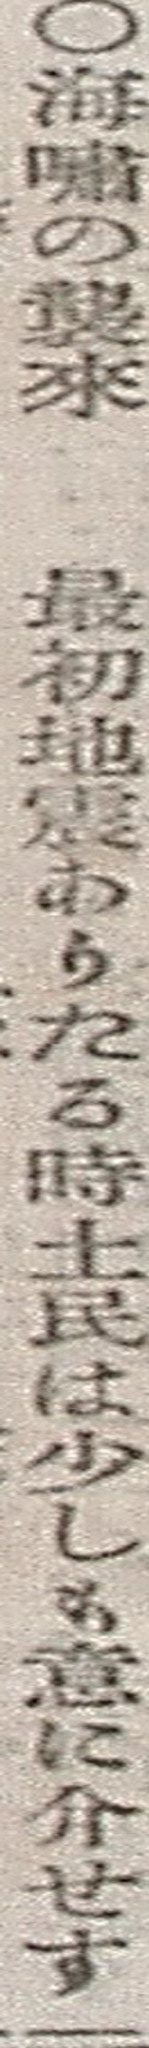〇海嘯の襲来最初地震ありたる時土民は少しも意に介せす
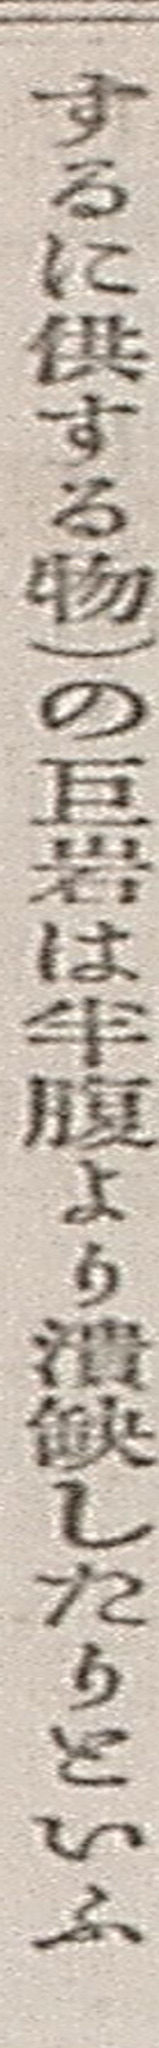するに供する物）の巨岩は半腹より潰欠したりといふ
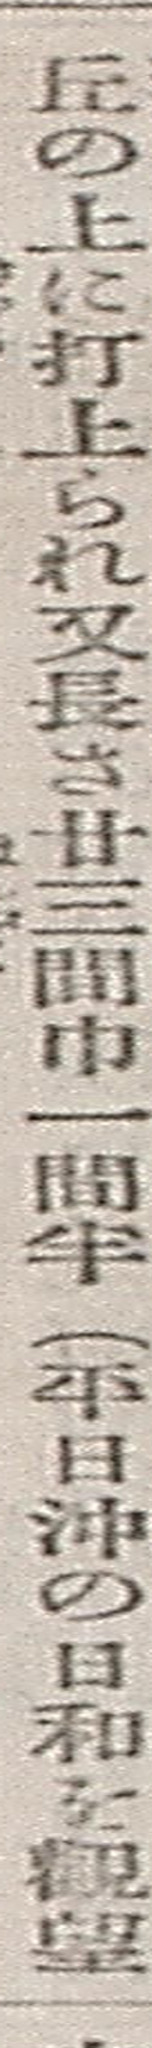丘の上に打上られ又長さ廿三間巾一間半の日和を観望
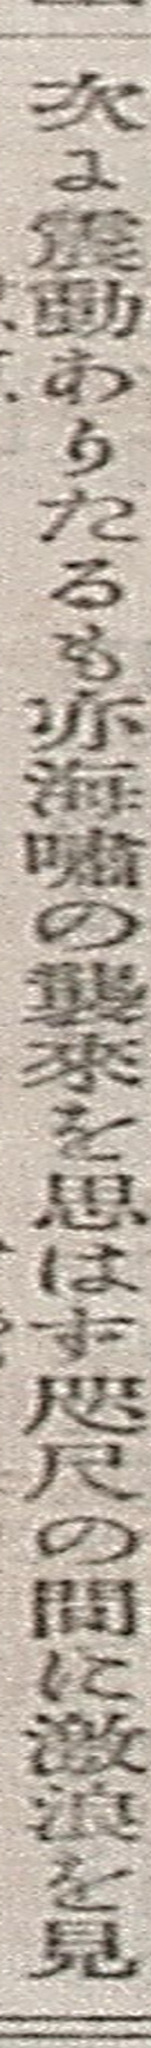次に震動ありたるも亦海嘯の襲来を思はず咫尺の間に激浪を見
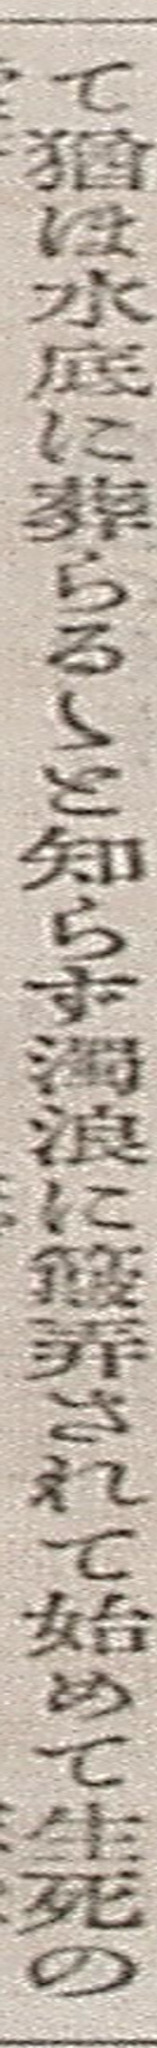て猶ほ水底に葬らるゝと知らず濁浪に簸弄されて始めて生死の
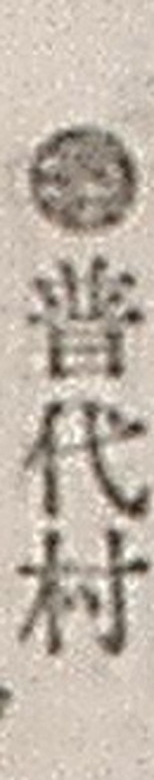●普代村
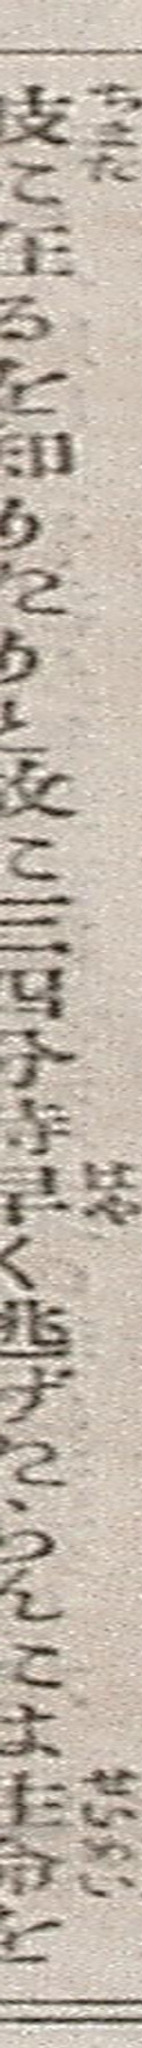岐に在るを知りたりと故に三四分時早く逃げたらんには生命を
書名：風俗畫報臨時増刊第百十九號　大海嘯被害録（中）
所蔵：東京大学地震研究所図書室 Earthquake Research Institute Library, The University of Tokyo, JAPAN
